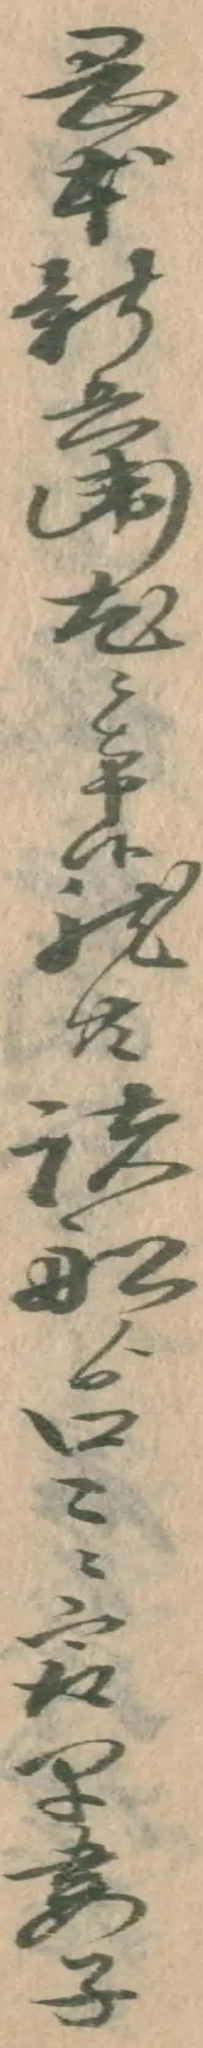岡本新兵衛尤にと申候然共諸船ゟ口々に最早妻子
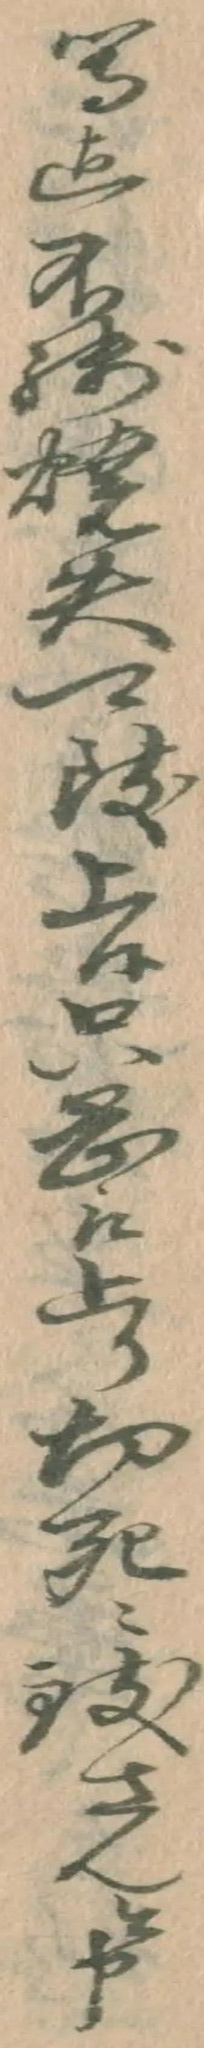等迄不残焼失可致上候只岡え上り切死に致さんと申

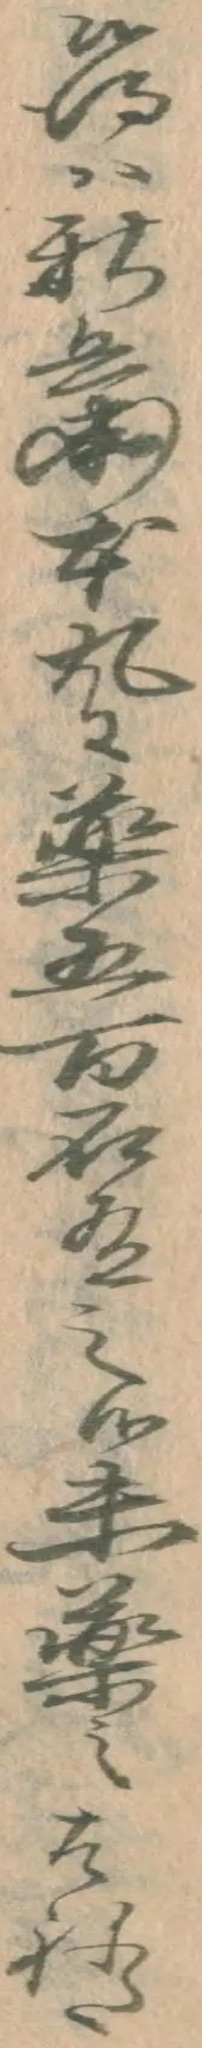候得は新兵衛本丸に薬五百石有之候未薬之さねた
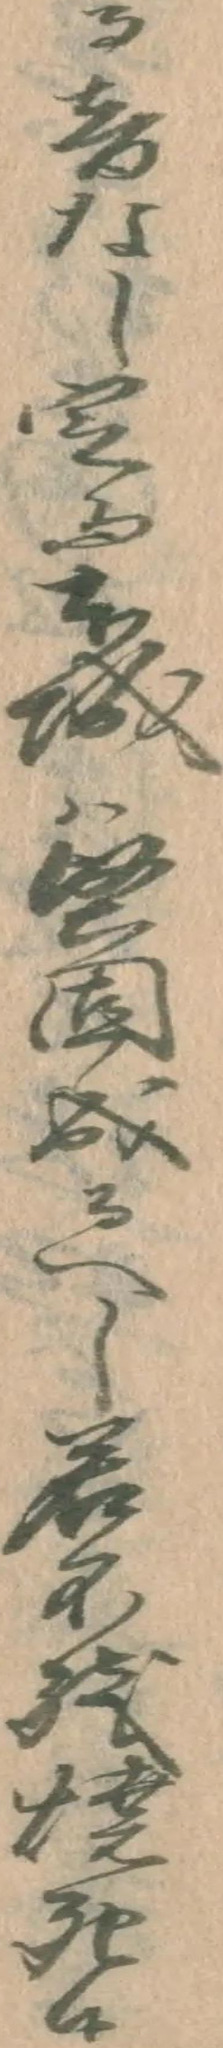る音なし定而本城は堅固成るへし若不残焼死候
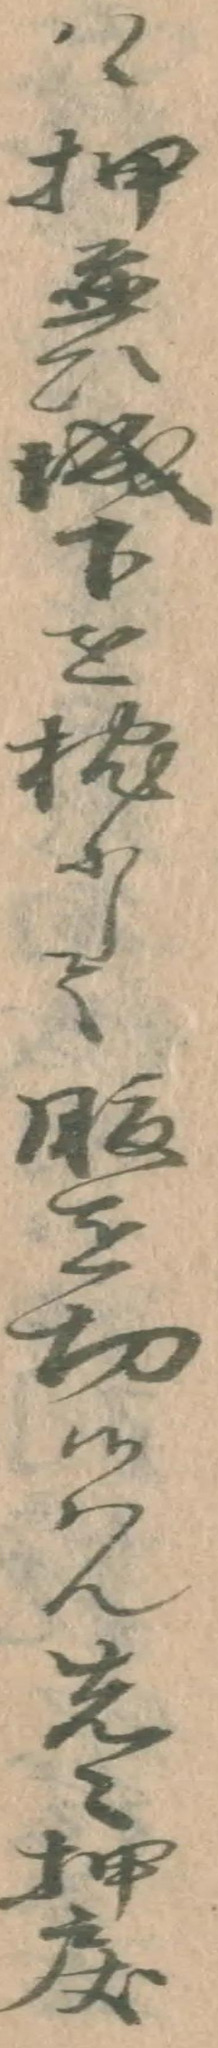はゝ押並ひ城下を枕にして腹を切候はん先々押戻
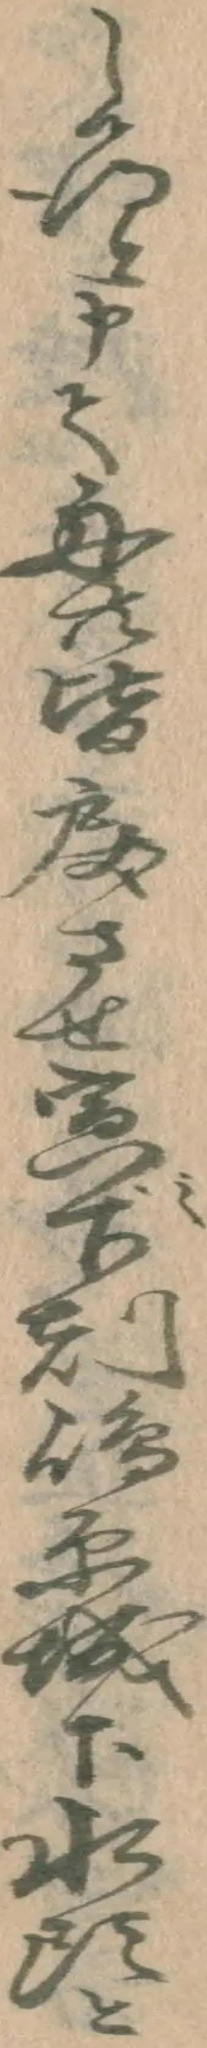し候得と申て舟共皆戻させ寅之下刻島原城下水頭と
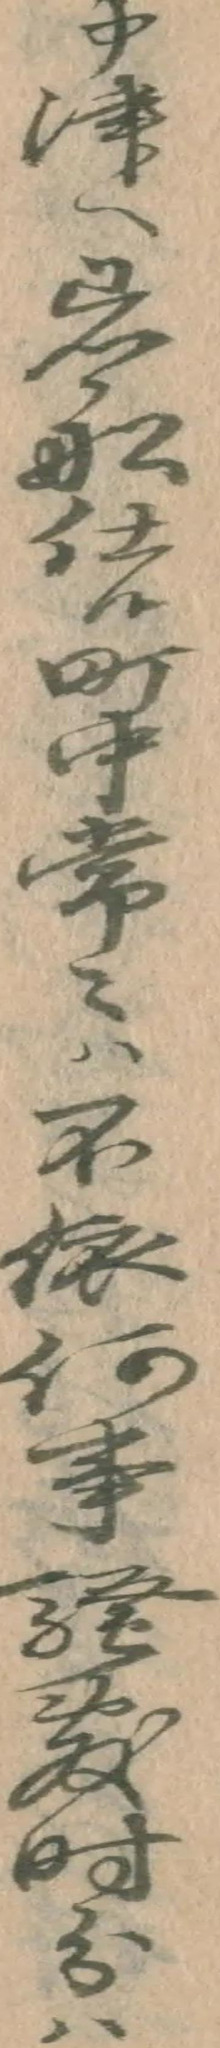中津へ着船仕候町中常々は不依何事騒敷時分は
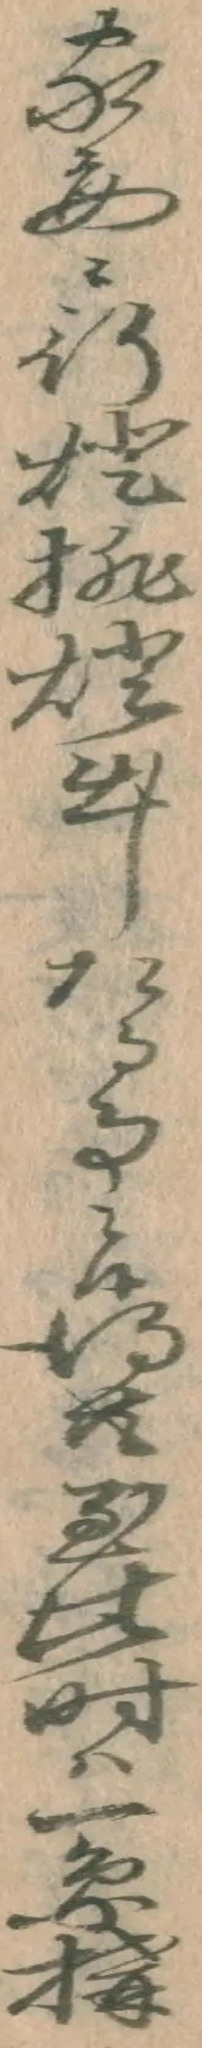家毎に行灯桃灯出したる事に候得共至此時は一円構
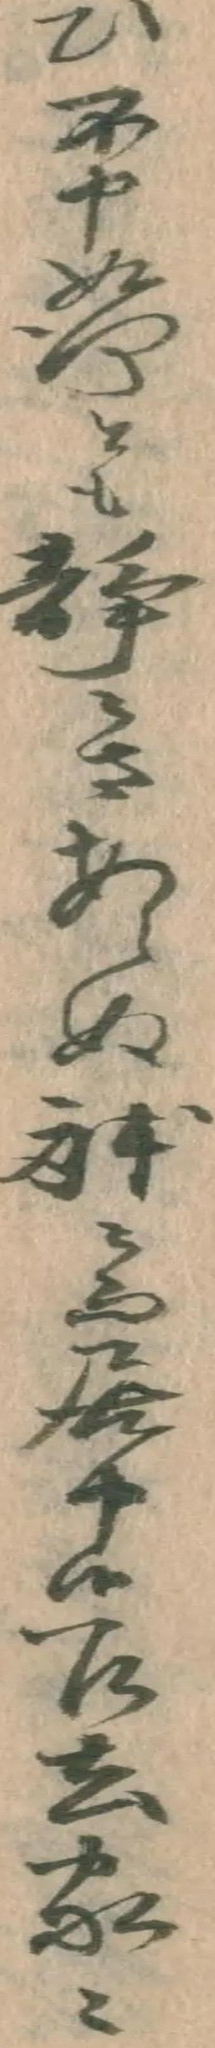ひ不申如何とも静にさあらぬ体に而居申候乍去家々
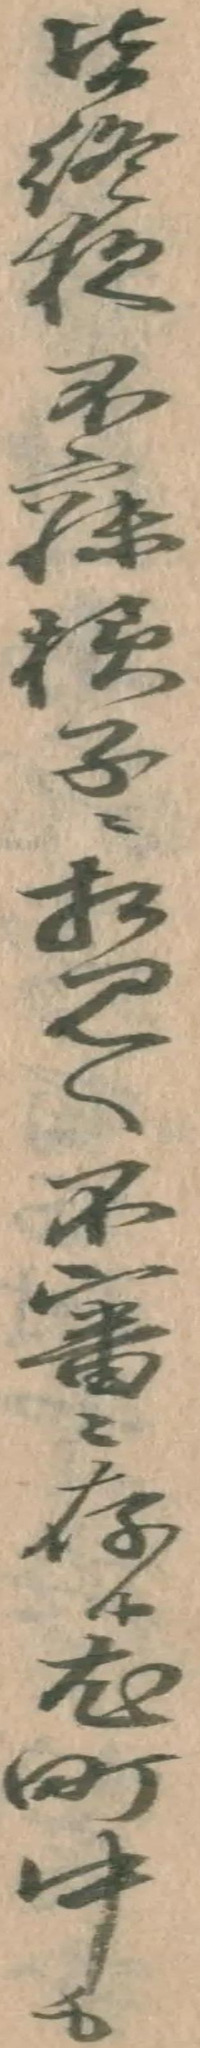皆終夜不寝様子に相見へ不審に存候尤町中も
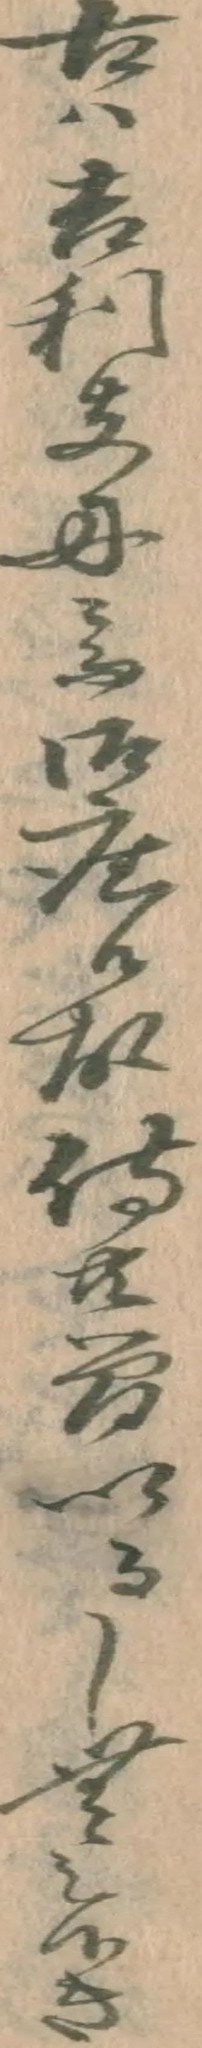古は吉利支丹に而御座候故侍共曽いるし無之候き
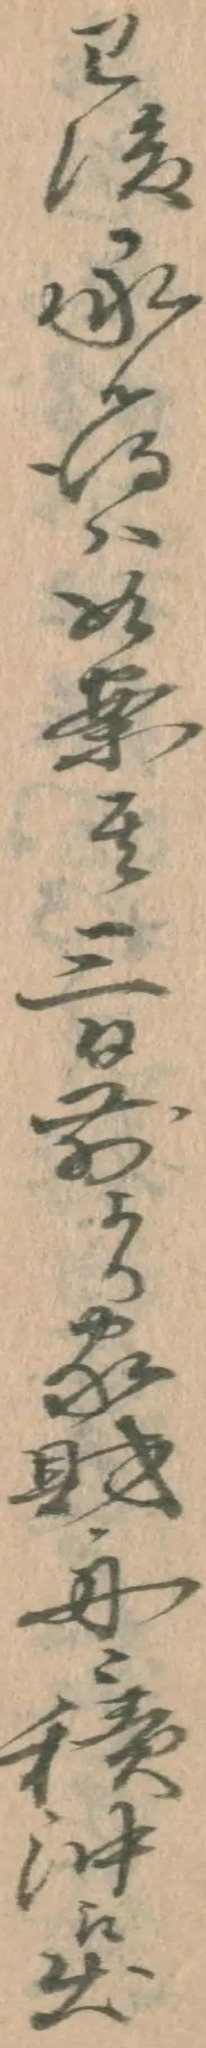已後承候得は如案其三日前より家財舟に積沖え出
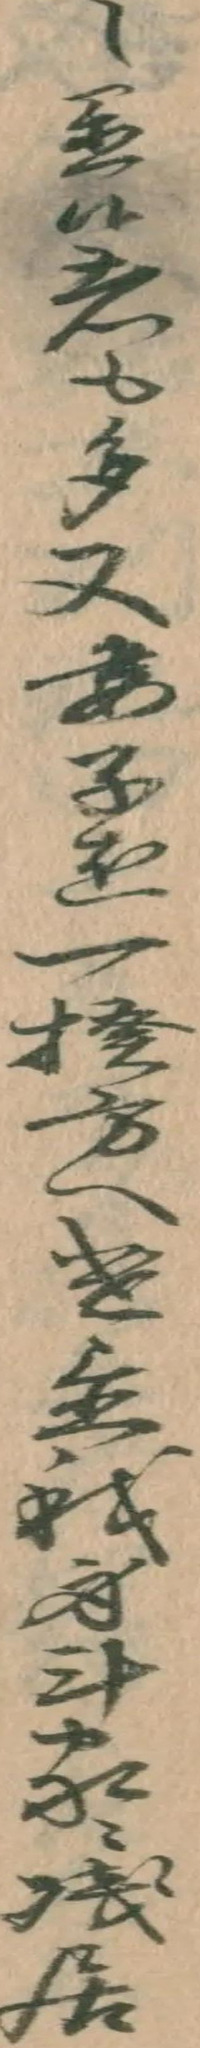し置候者も多又妻子を一揆方へ遣置我身斗家に残居
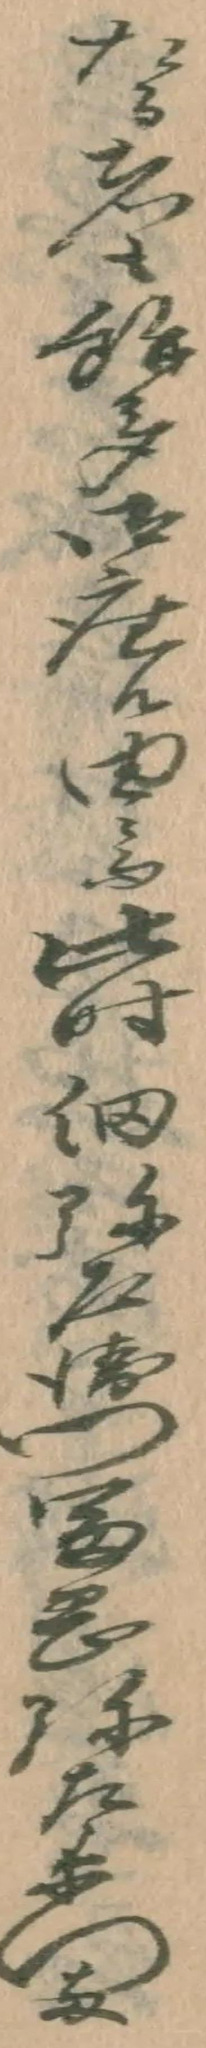たる者も余多御座候由に而此時佃弥左衛門富岡弥左衛門両
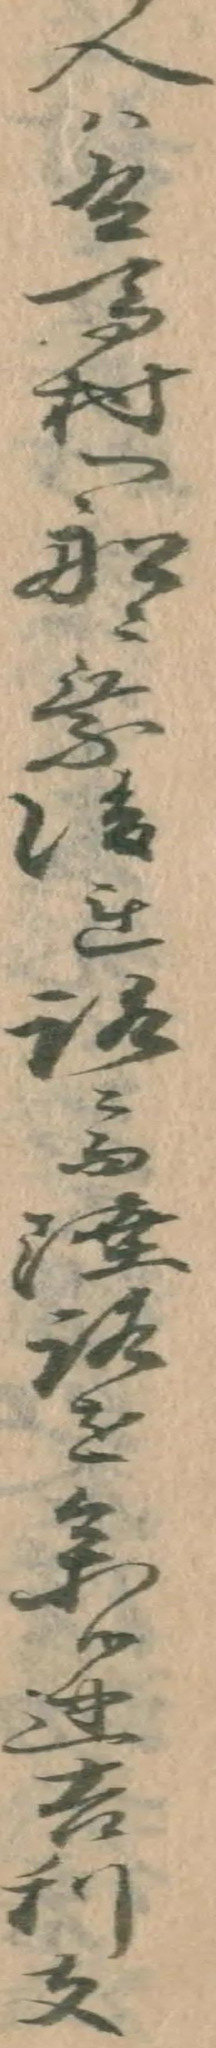人は有馬村へ船に乗後れ路に而陸路を参候迚吉利支
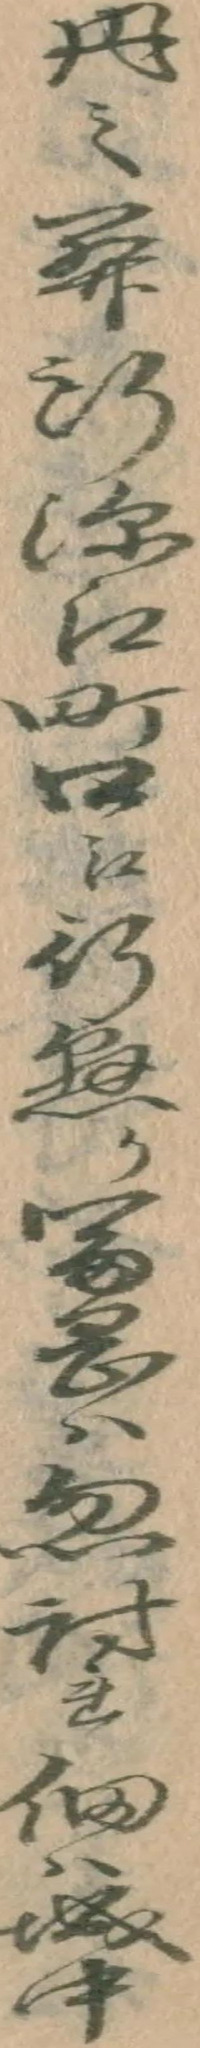丹之関所深江町口え行懸り富岡は忽討れ佃は城中
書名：切支丹御退治記 49巻. [1]
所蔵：国立国会図書館 National Diet Library, JAPAN
